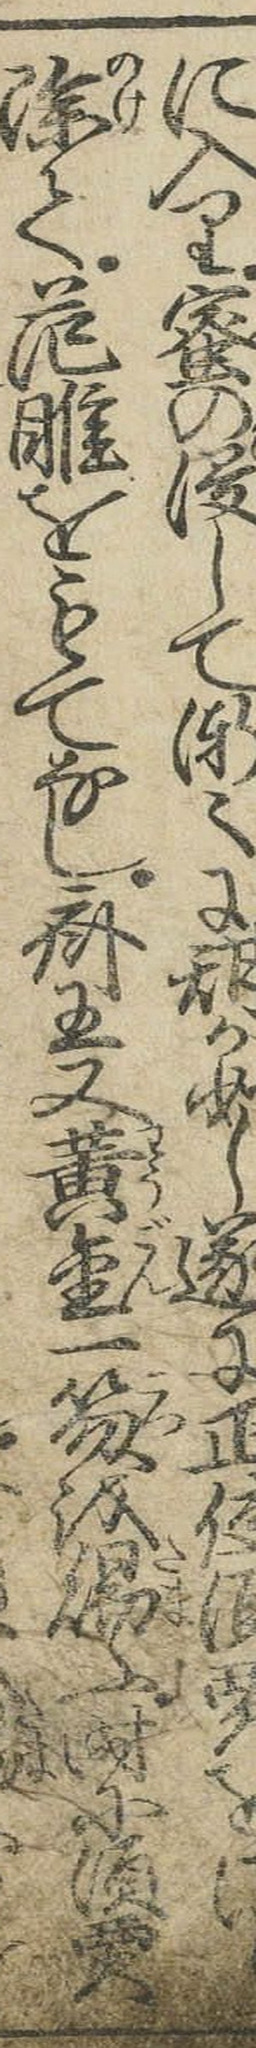除て。范雎をもてなし。斉王又黄金一笏を賜ふ。時に須賈

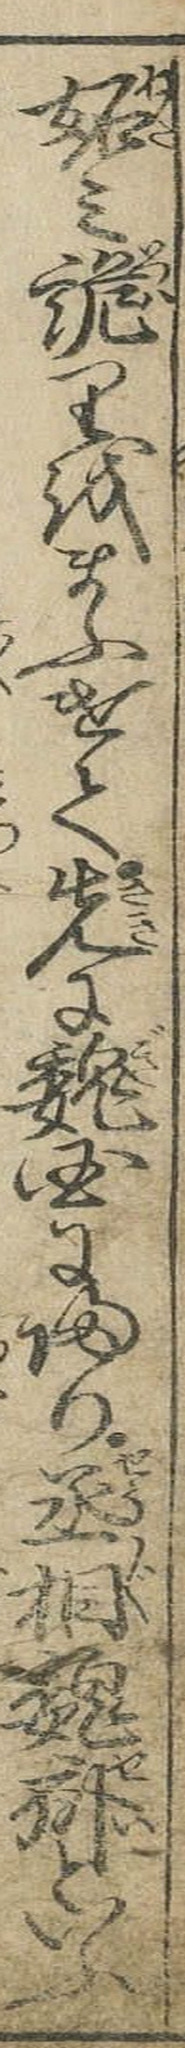妬み詭りをまふせて先に魏国に帰り。丞相魏斉といふ
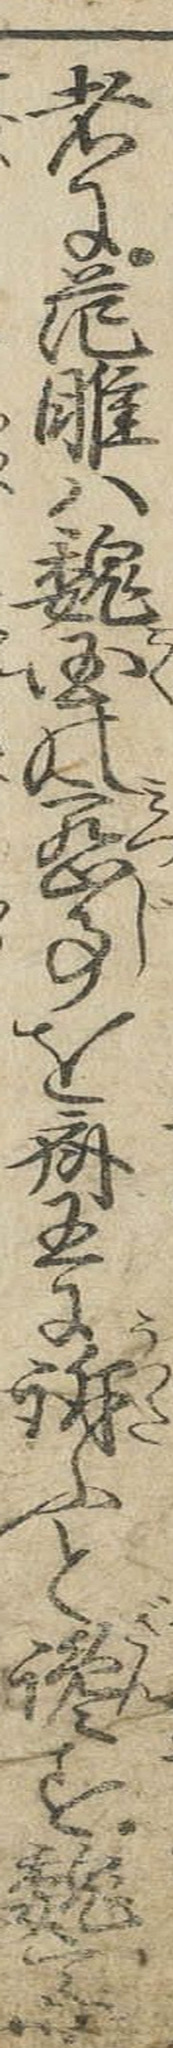者に。范雎は魏国の密事を斉王に訴ふと讒す。魏斉
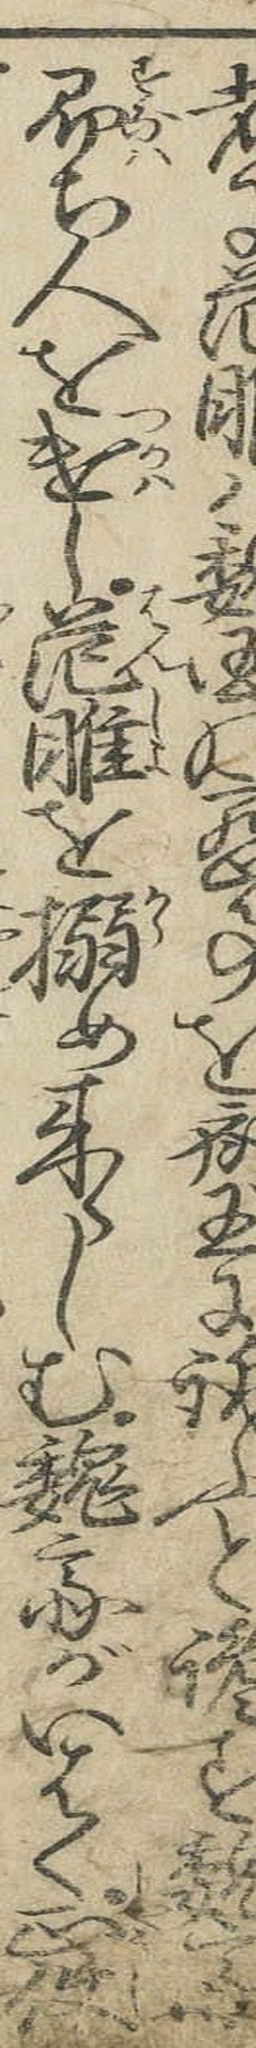即ち人を遣し。范雎を搦め来らしむ。魏斉がいはく。正使
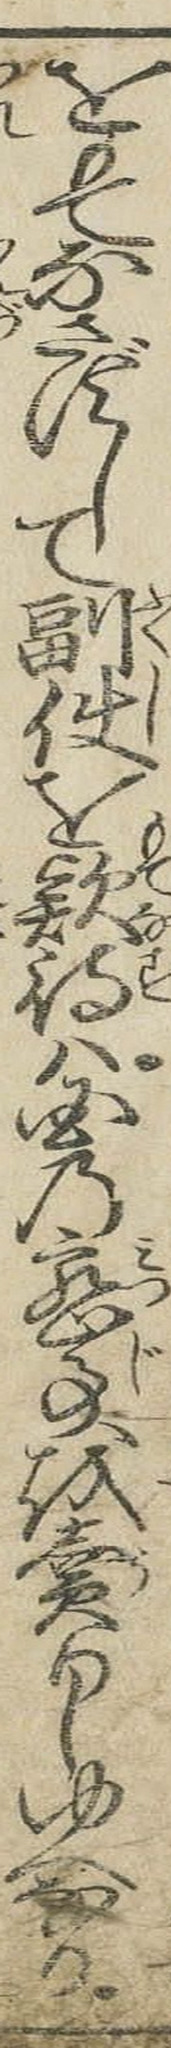をもてなさずして副使を款待は。国の密事を売りしゆへなり。
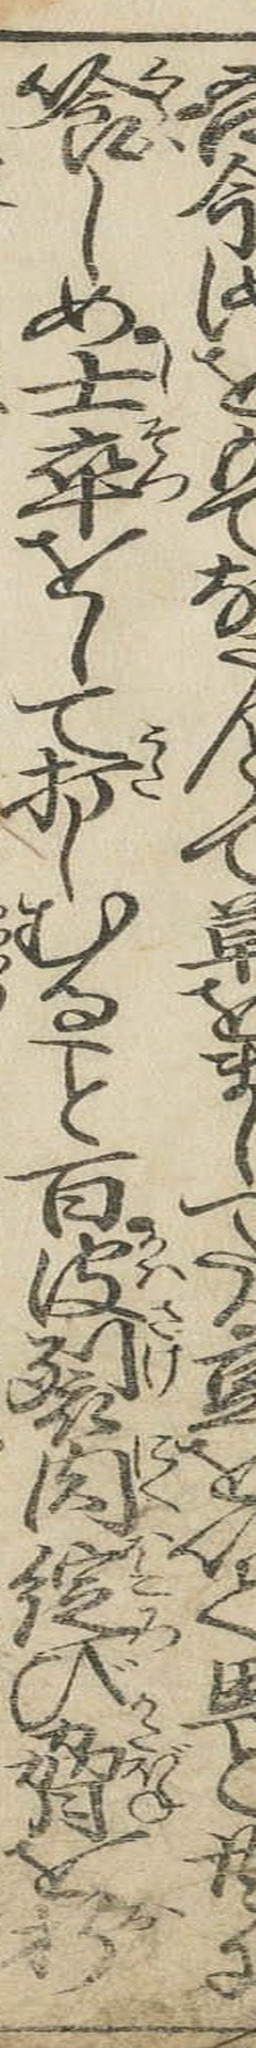喰しめ。士卒をして打しむること百。皮裂肉綻び脅を折
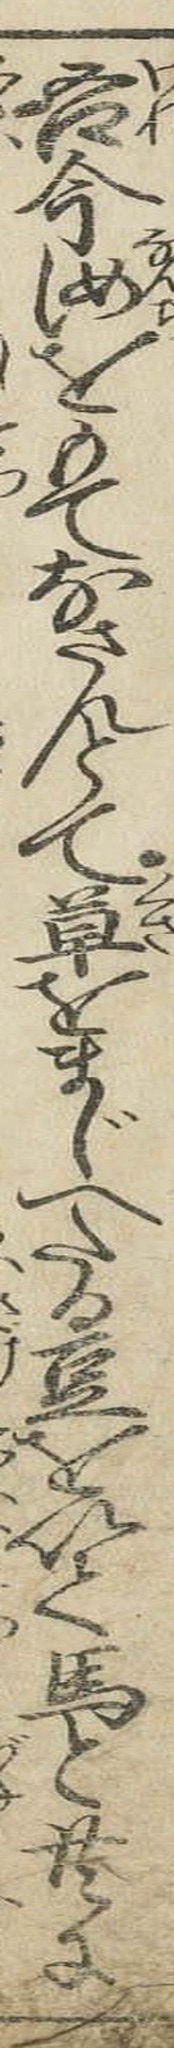吾今汝をもてなさんとて。草をまじへたる豆を以て馬と共に
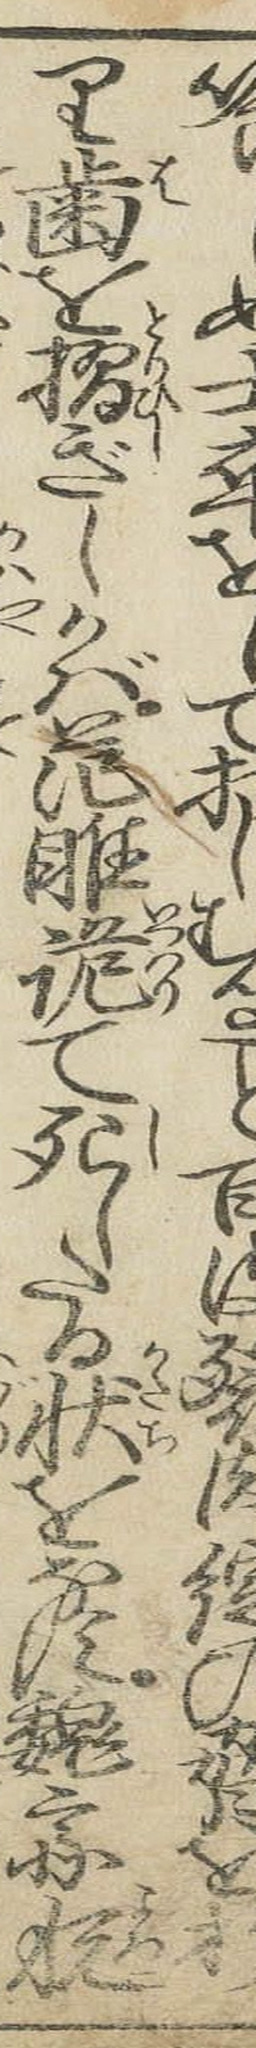り歯を摺ぎしかば。范雎詭て死したる状をなす。魏斉悦
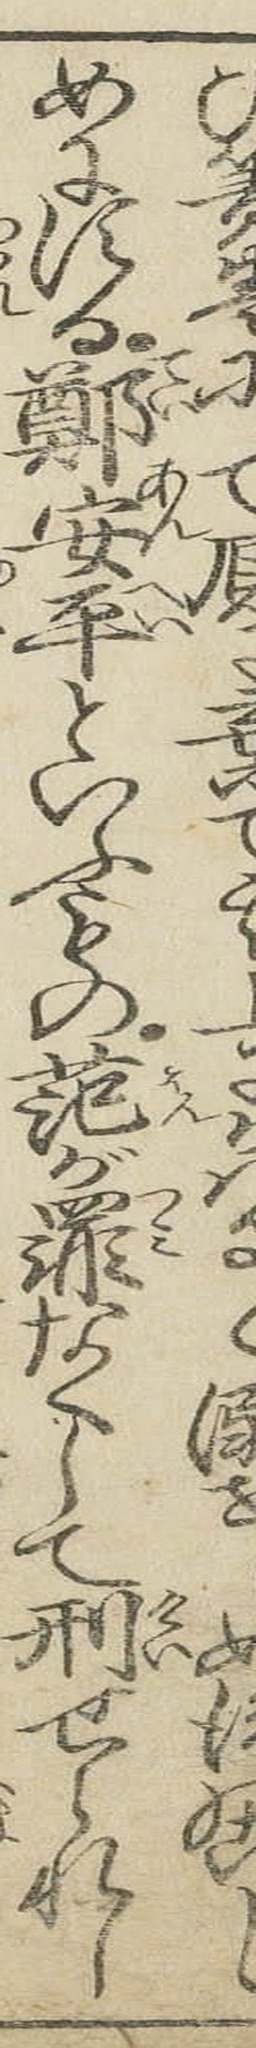めにする。鄭安平といふもの。范が罪なくして刑せられし
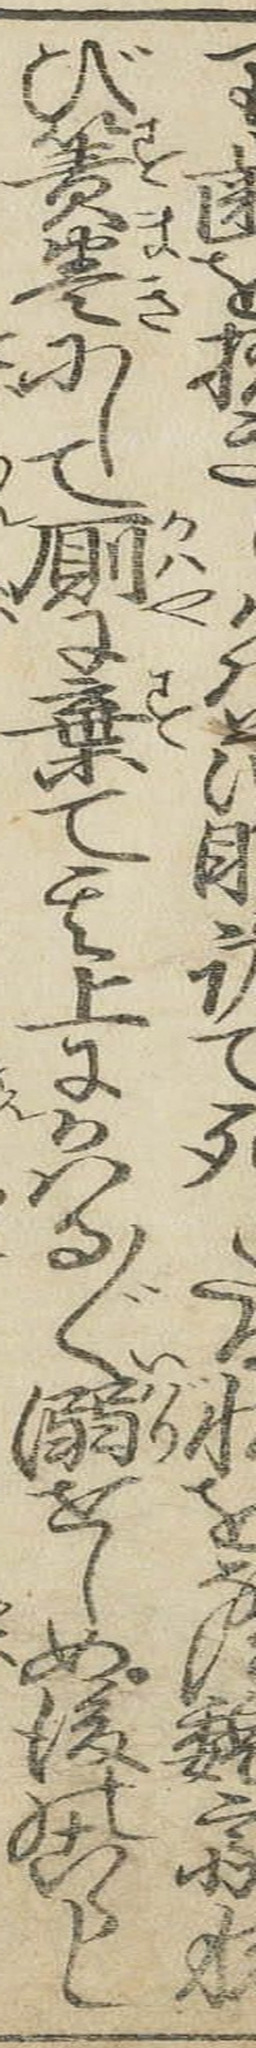び簀巻にして厠に棄て其上にかはる〴〵溺せしめ。後のこらし
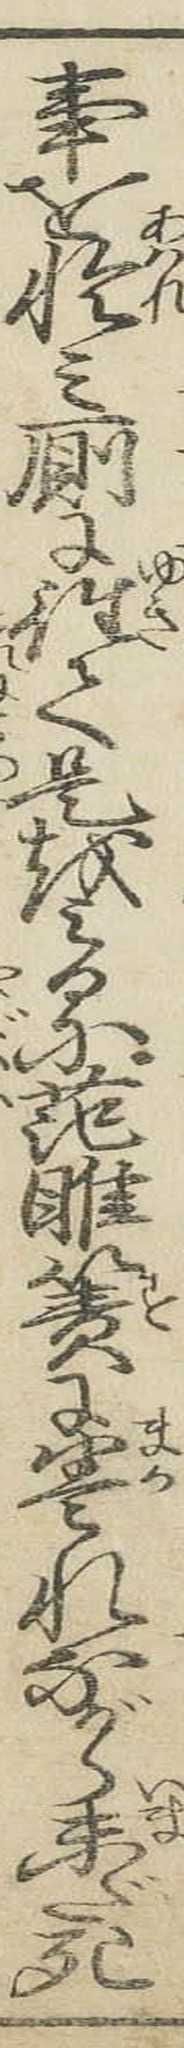事を怜み厠に往て是をみるに。范雎簀に巻れながら未だ死
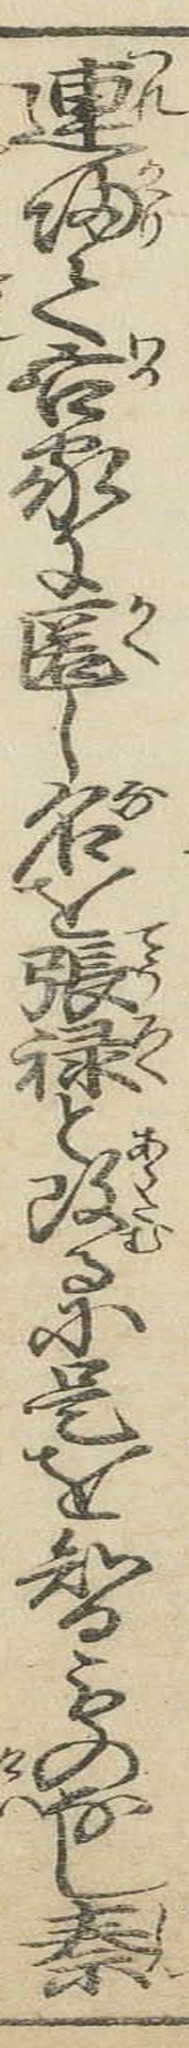連帰て吾家に匿し名を張禄と改るに是を知るものなし秦
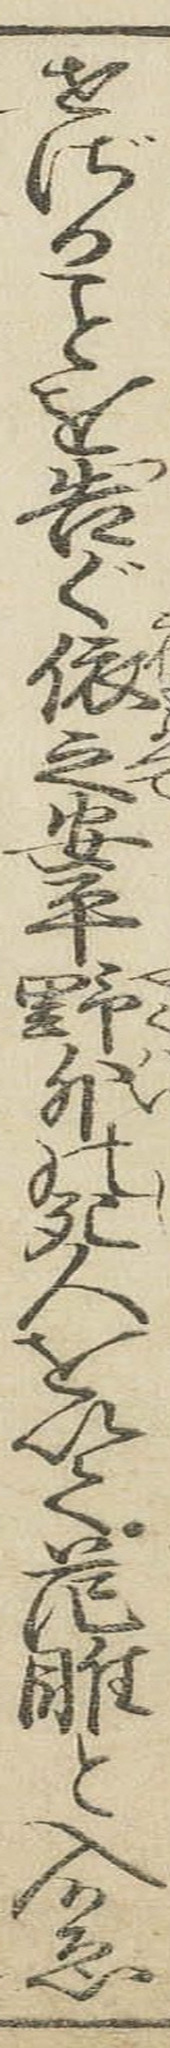せざることを告ぐ依之安平野外の死人を以て。范雎と入かゑ
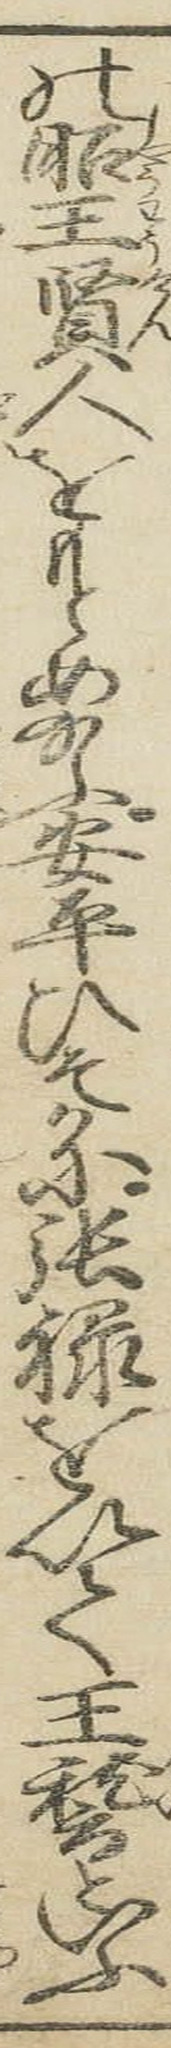の昭王賢人をもとめ給ふ。安平ひそかに。張禄を以て王稽といふ
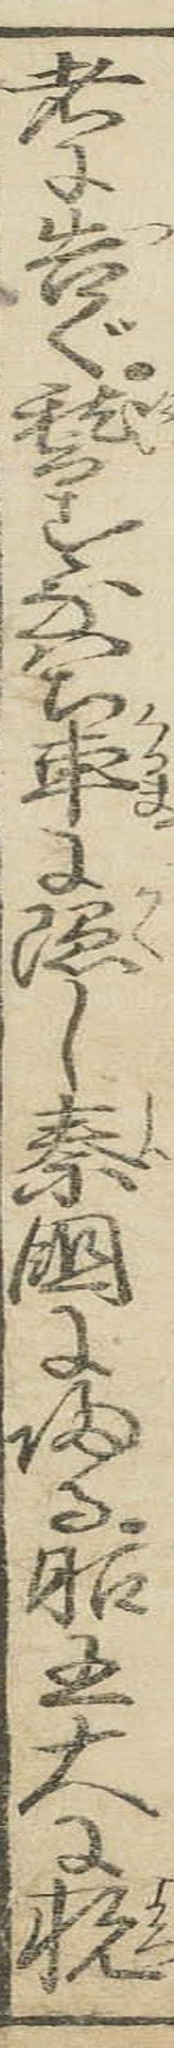者に告ぐ。稽すなはち車に隠し秦国に帰る。昭王大に悦
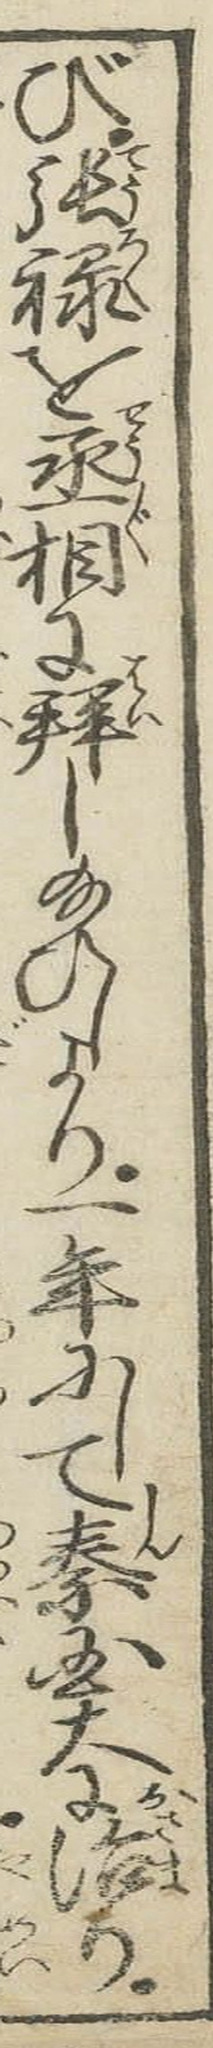[こ]び。張禄を丞相に拝し給ひしより。一年にして秦国大に治り。
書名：絵本写宝袋 9巻 7之巻
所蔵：東京学芸大学教育コンテンツアーカイブ
